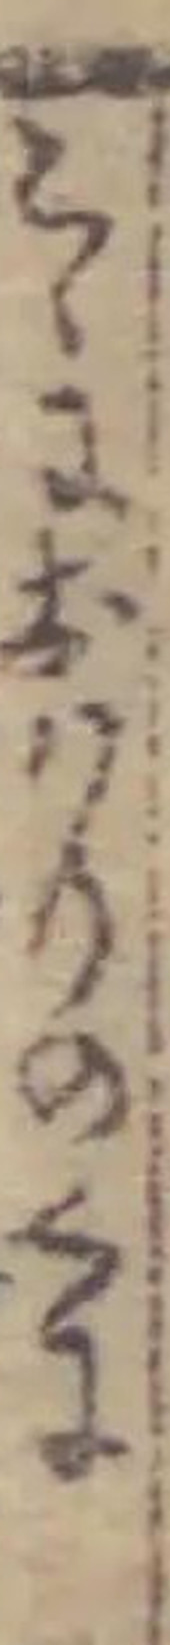こゝにおはりのくに
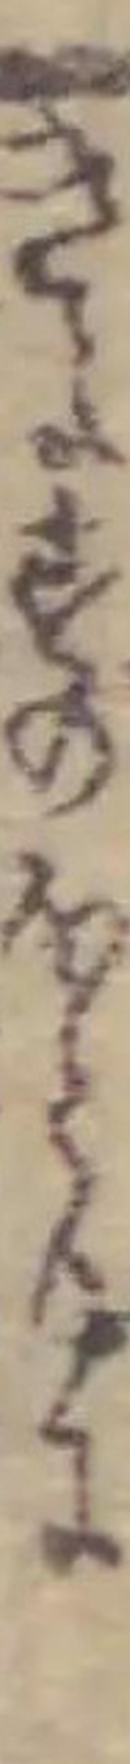きよすのほとりに
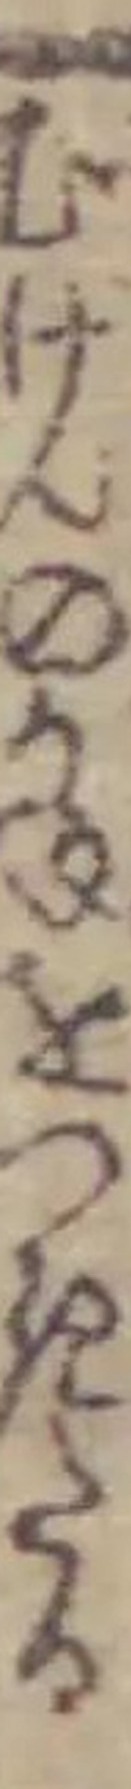むけんのかねをつきたる
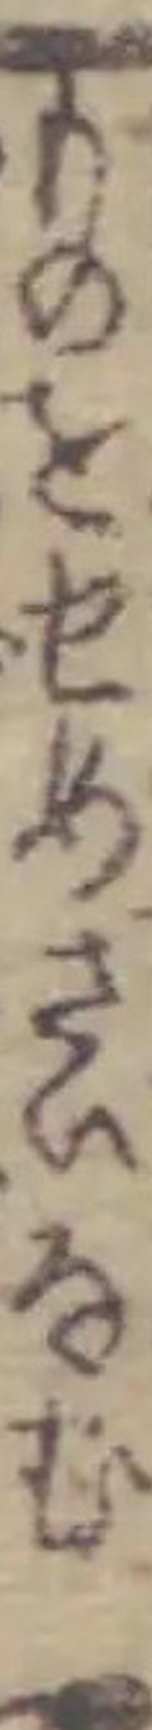ものをせめさいなむ
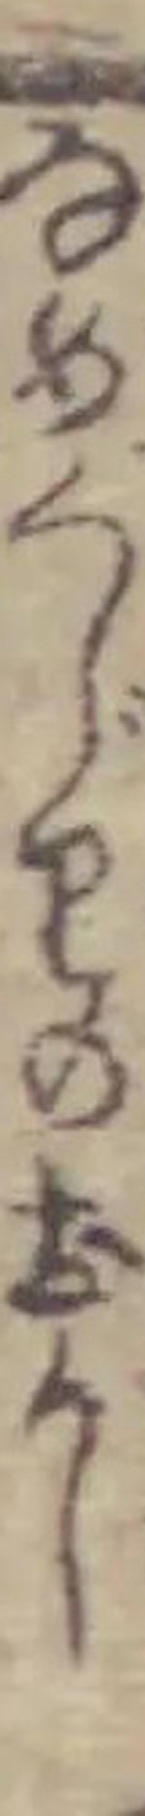なめくじりのおかし
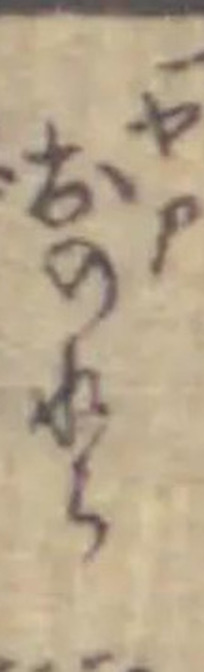おのれら
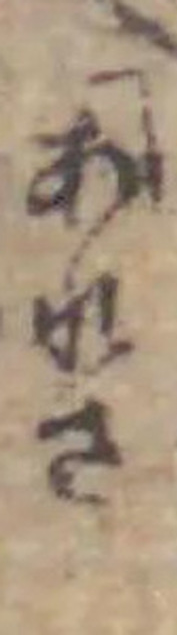〽あれさ
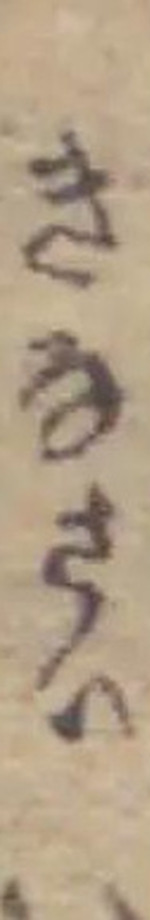きなさい
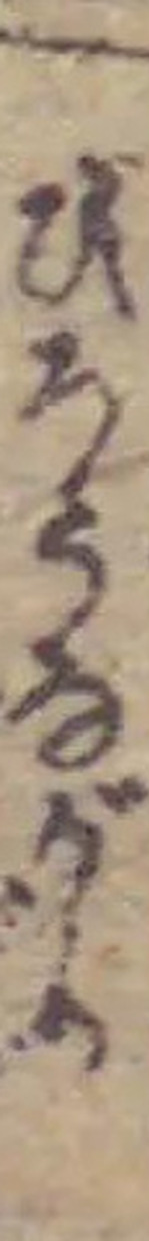びろうながら
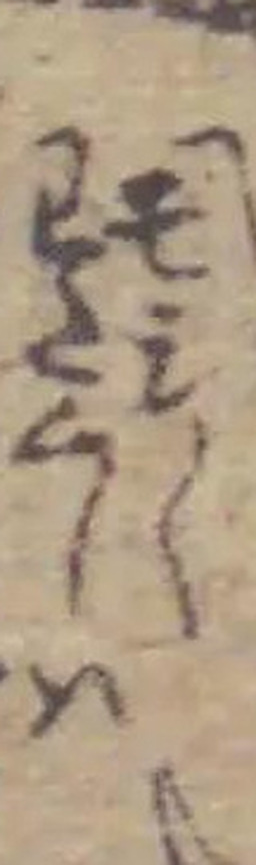わたくしは
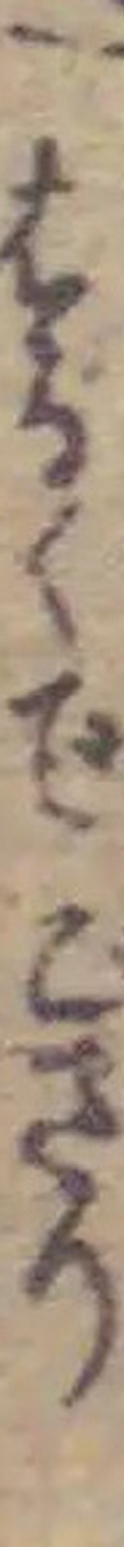はらくでごさり
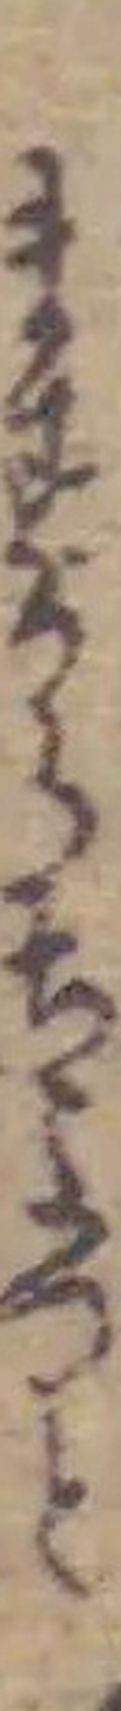ますからちよつと
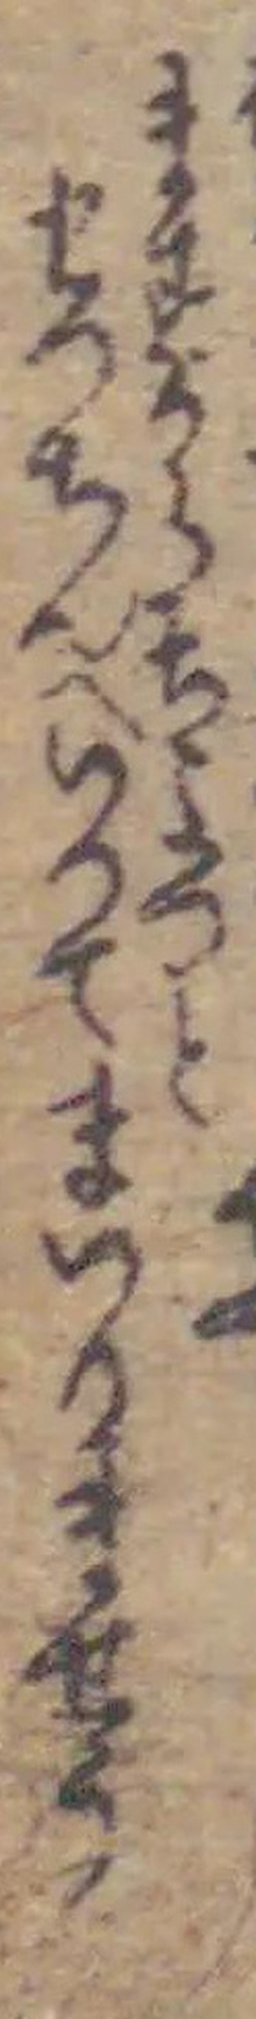せつちんへいつてまいりませう

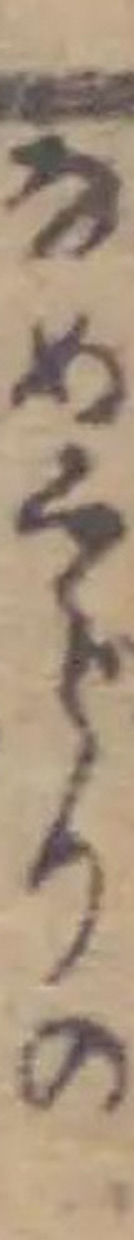なめくじりの
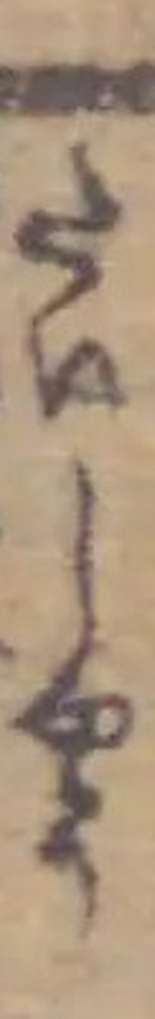たいしやう
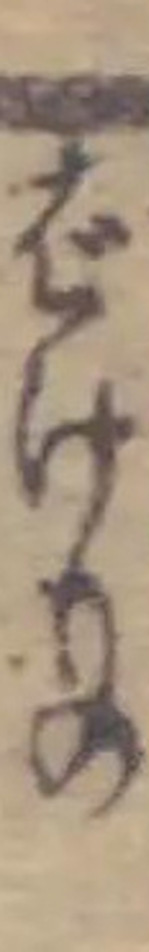ばけもの
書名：化物太平記 3巻
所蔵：国立国会図書館 National Diet Library, JAPAN
